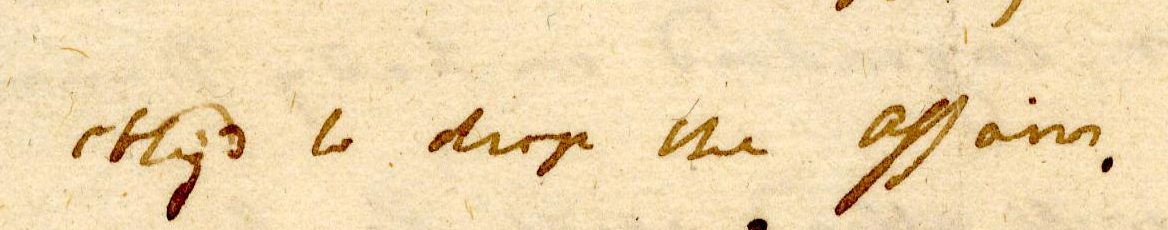cply'd to drop the affair
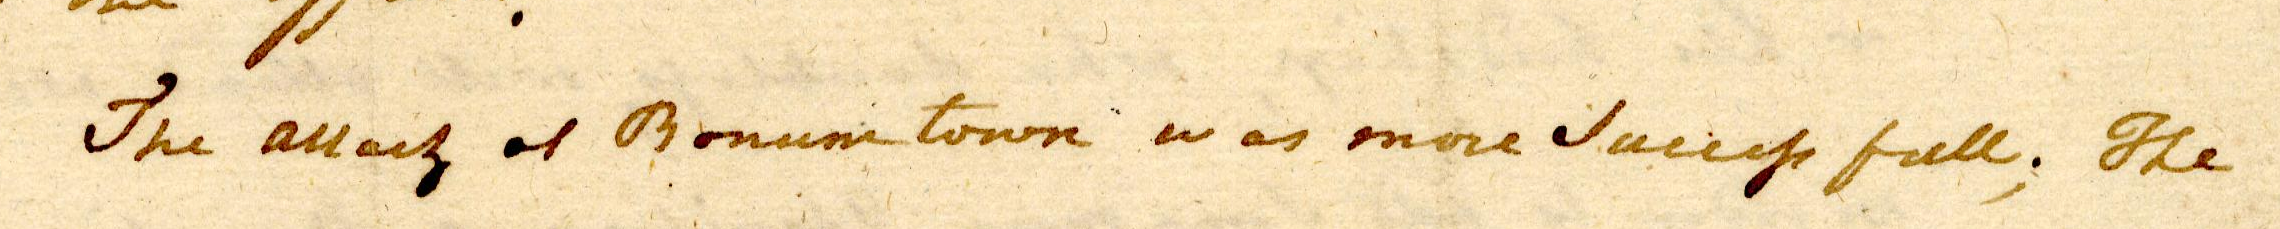The Attack of Bowen town was more successfull. The
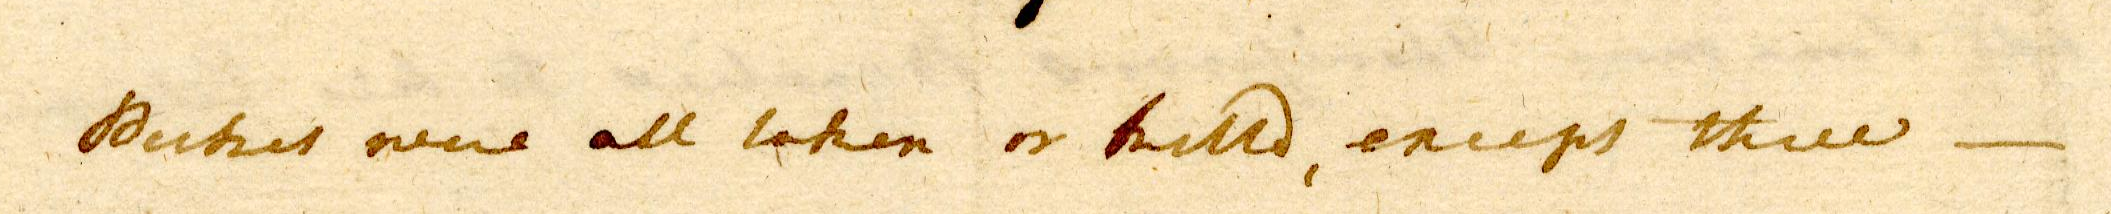Buckes were all taken or killd except three.-
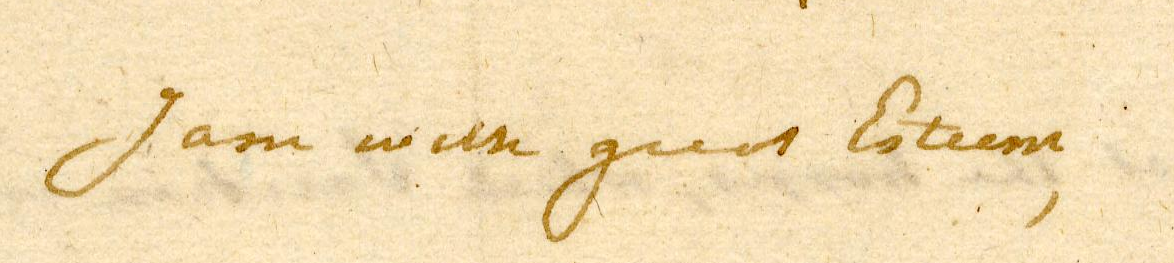I am with great Esteem
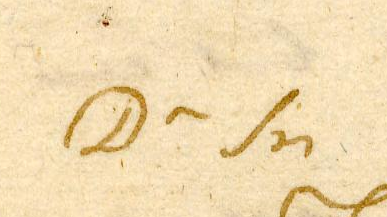D^r. Sir
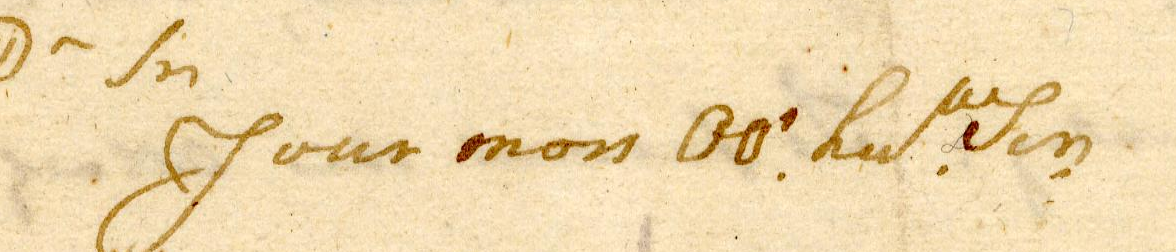I our most Ob^g. Let^r. Sign
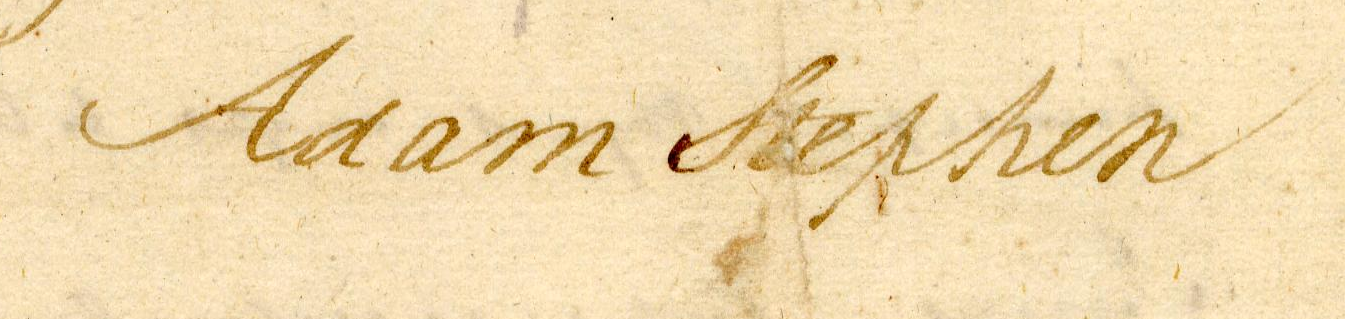Adam Stephen
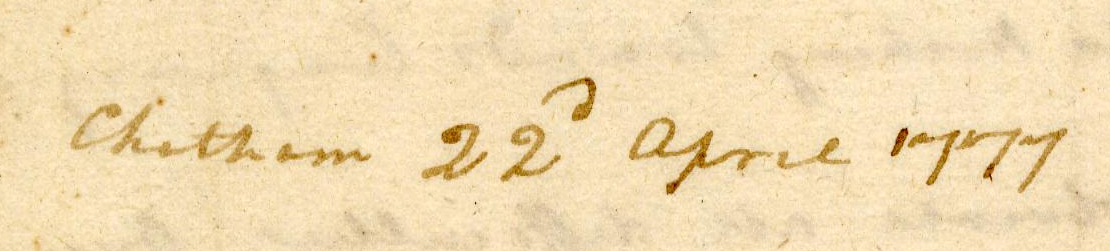Chitham 22^d April 1777
